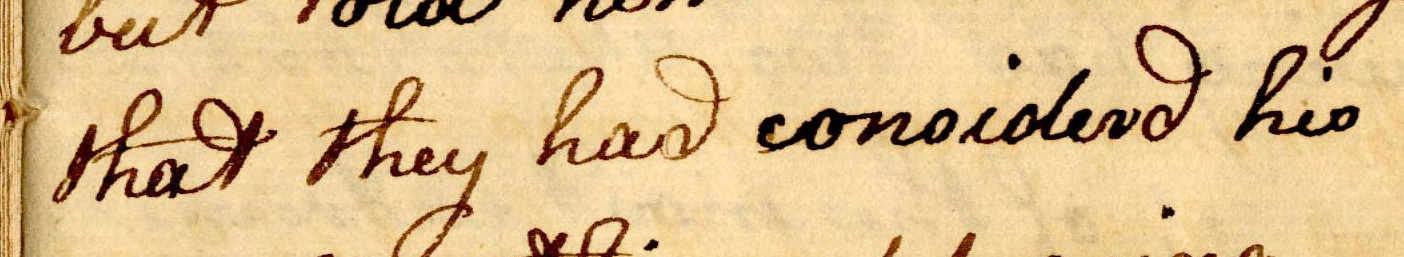that they had considered his
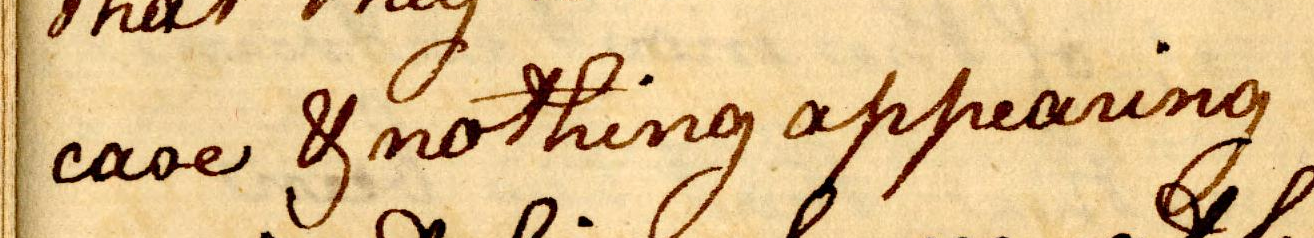case & nothing appearing
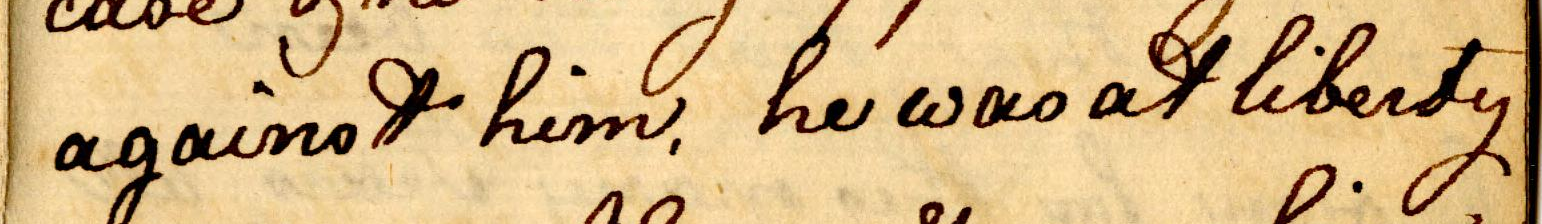against him, he was at liberty
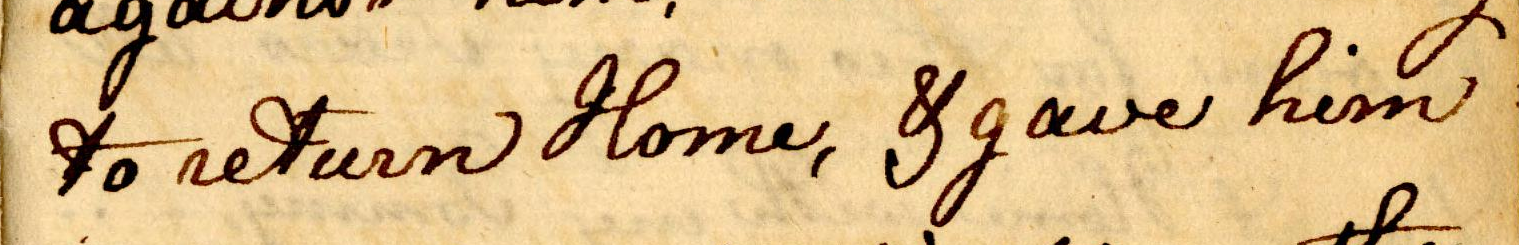to return Home, & gave him
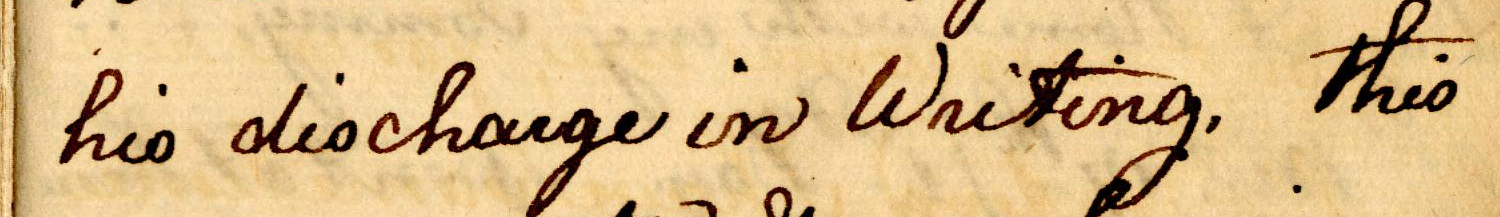his discharge in Writing, this
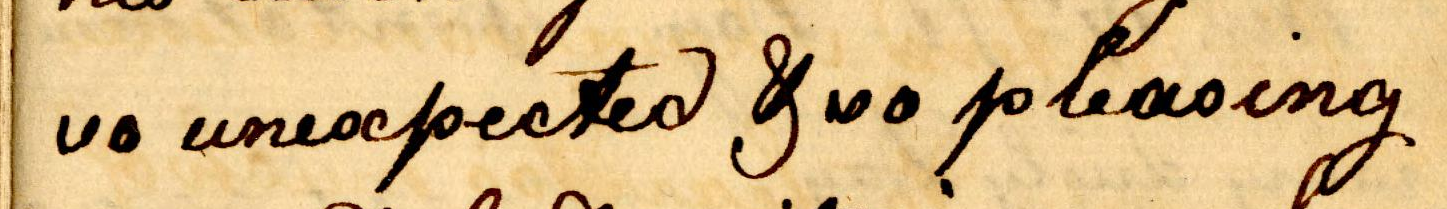so unexpected & so pleasing
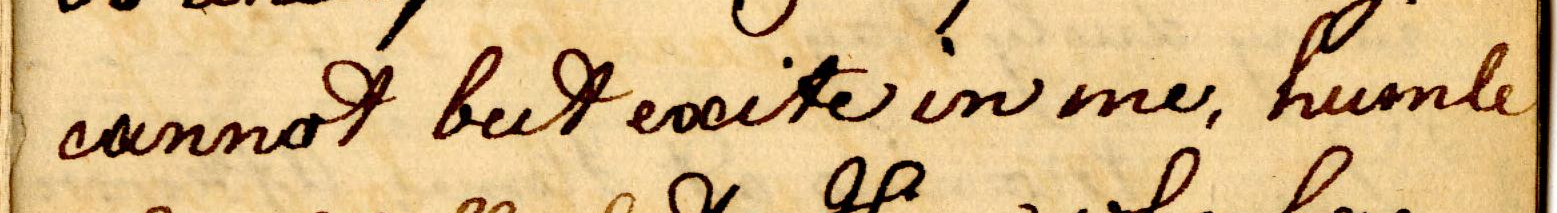cannot but excite in me, humle
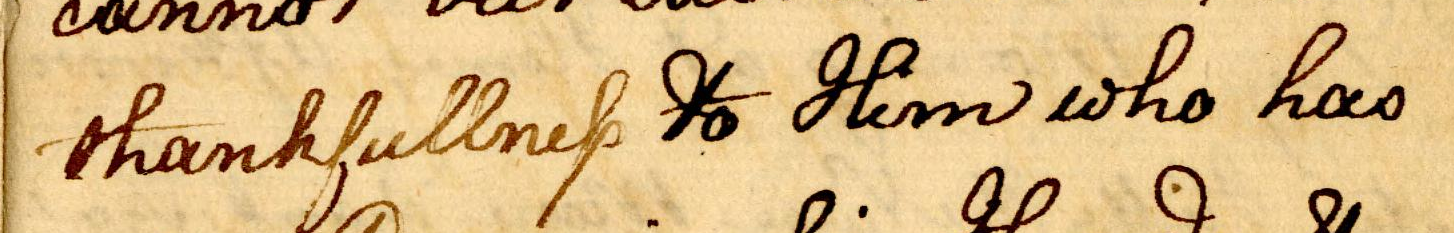thankfullness to Him who has
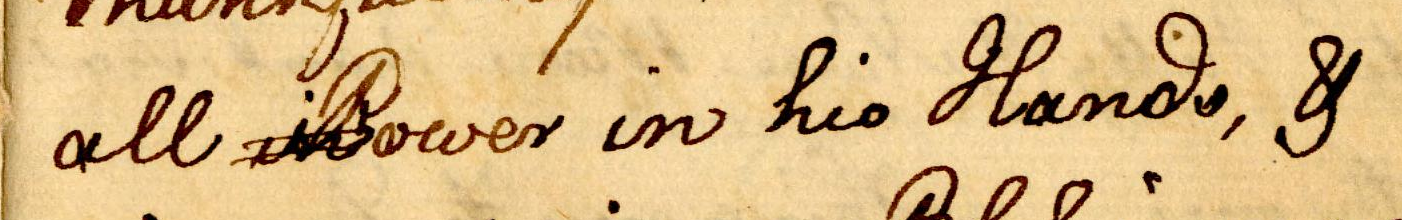all Power in his Hands, &
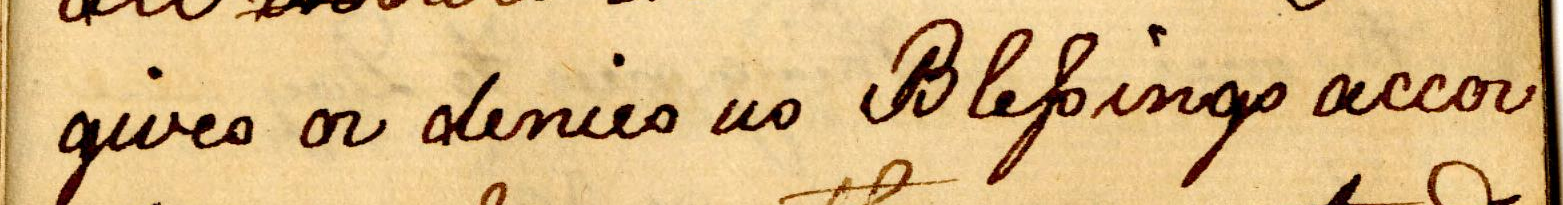gives or denies us Blessings accor
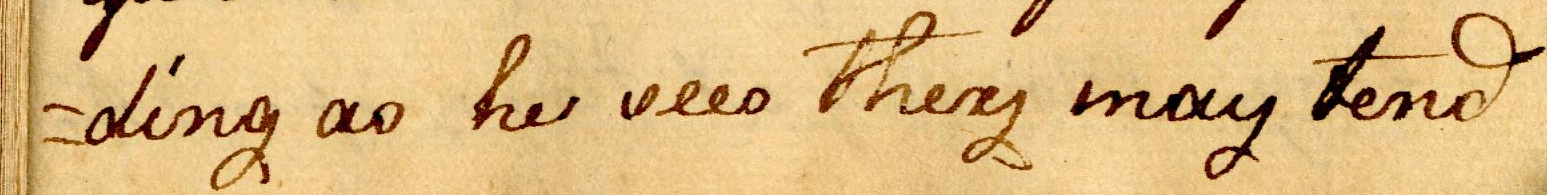-ding as he sees they may tend
